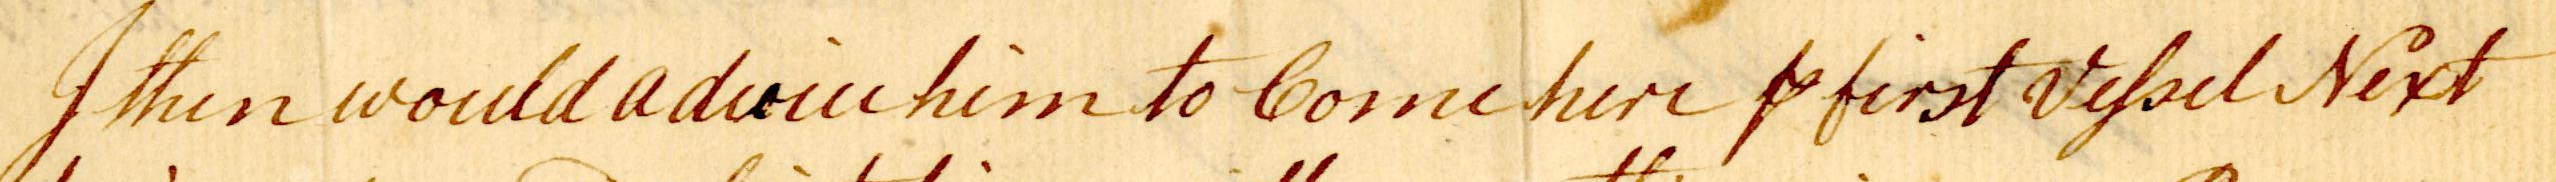I then would advice him to Come here per first Vessel Next
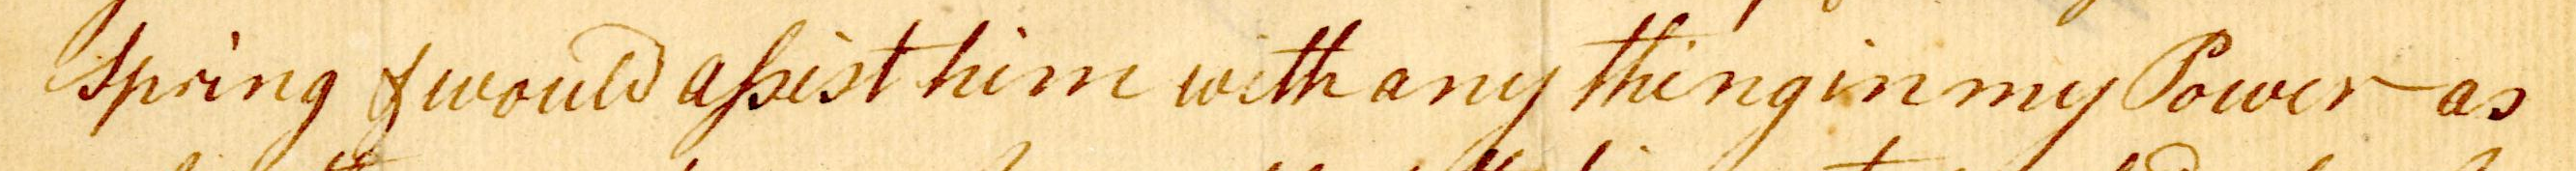Spring & would assist him with any thing in my Power as
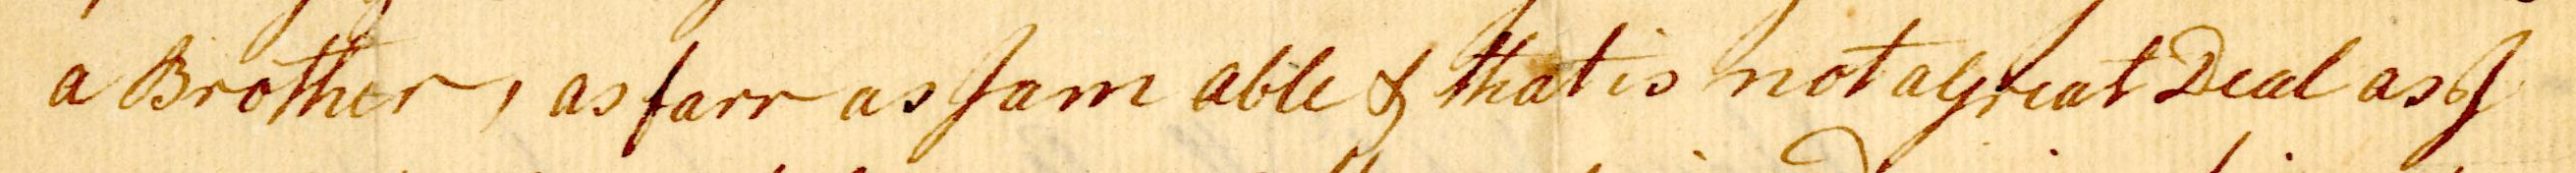a Brother, as farr as I am able & that is not a great Deal as I
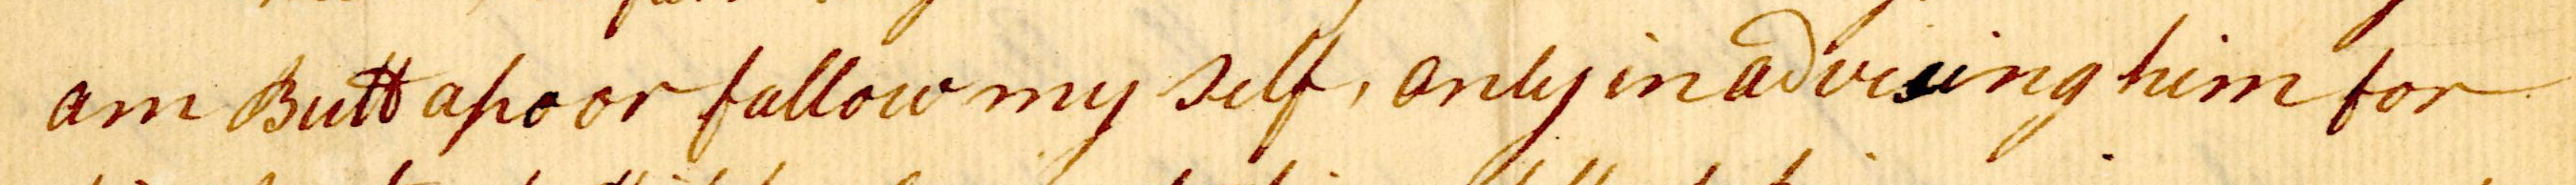am Butt a poor fallow my self, only in advising him for
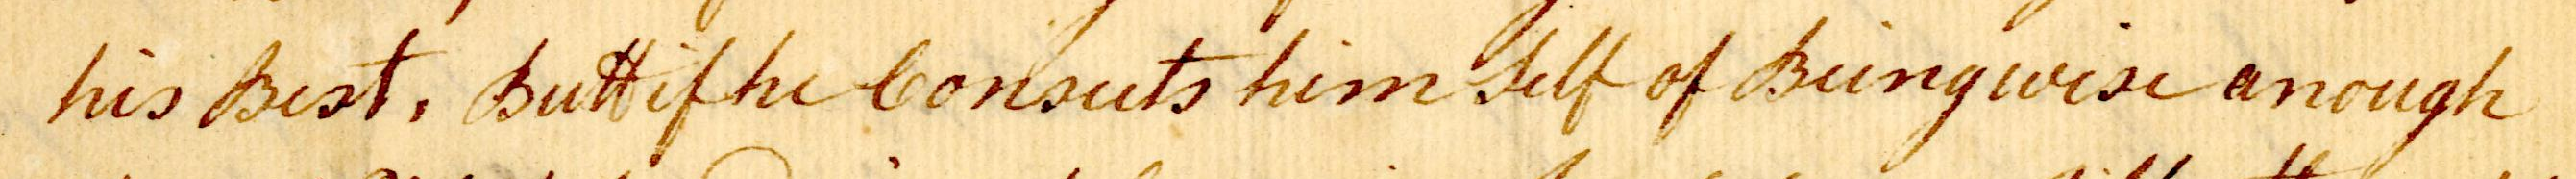his Best, Butt if he Consuts him self of Being wise anough
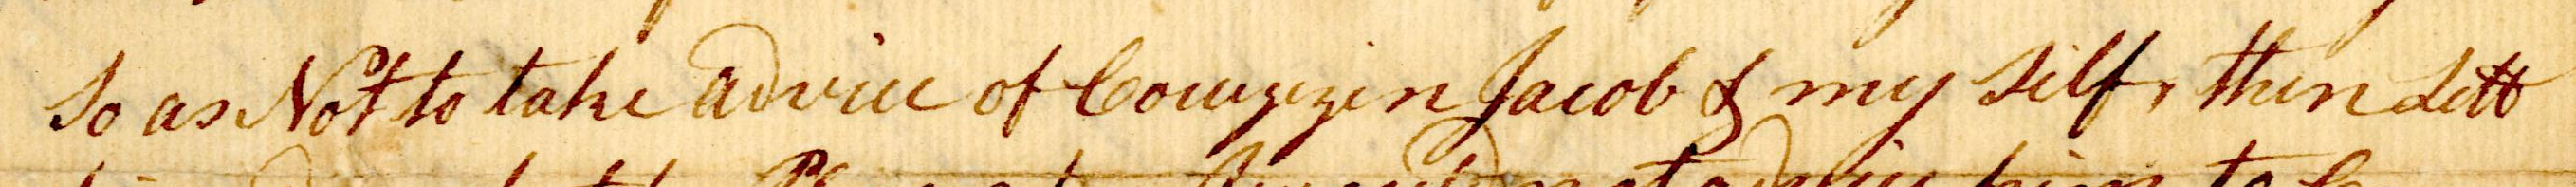So as Not to take advice of Couzzin Jacob & my self then Lett
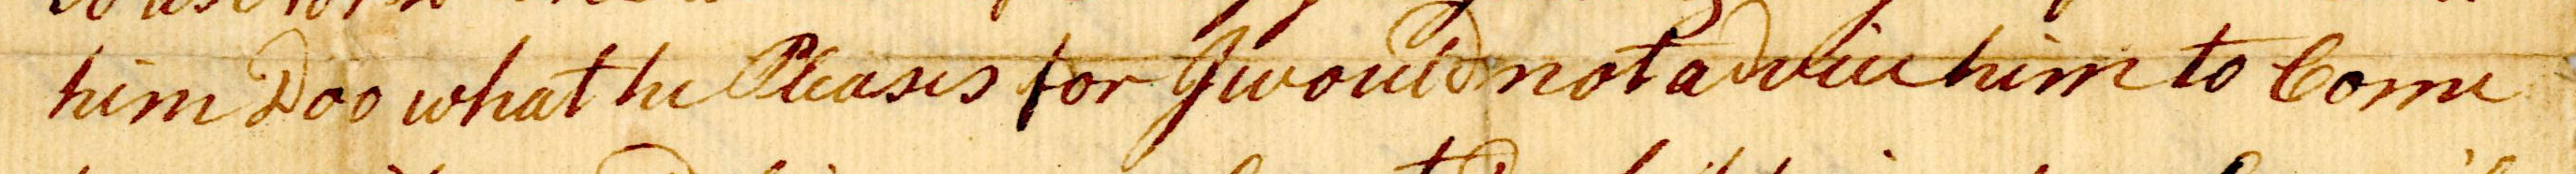him Doo what he Pleases for I would not advice him to Come
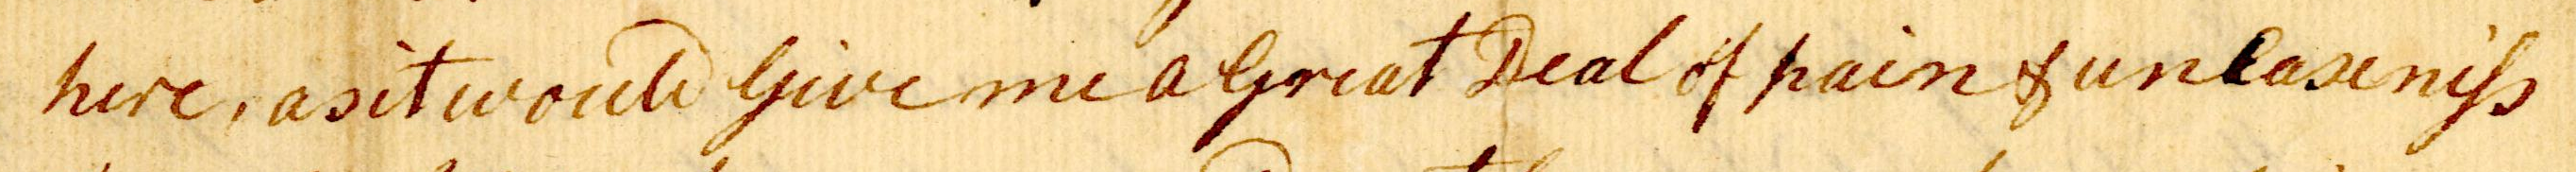here, as it would Give me a Great Deal of pain & uneaseniss
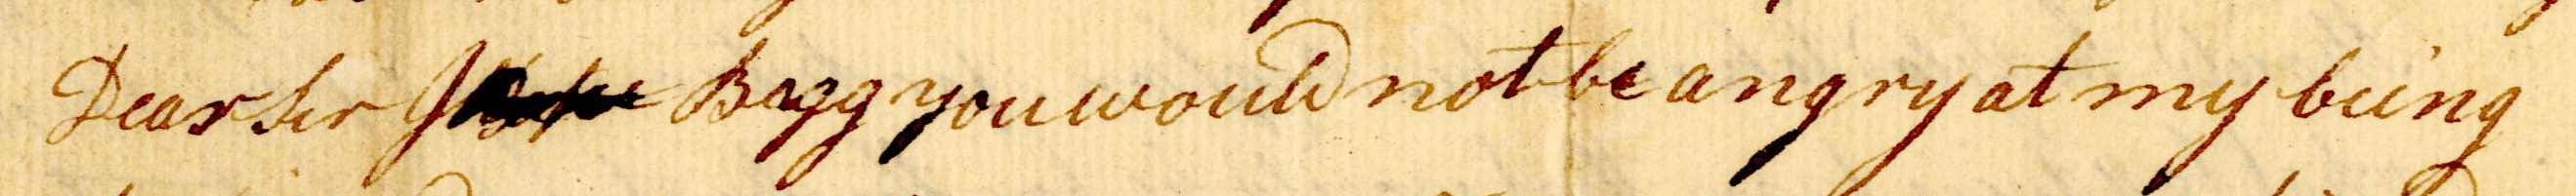dear Sir I [_____] Begg you would not be angry at my being
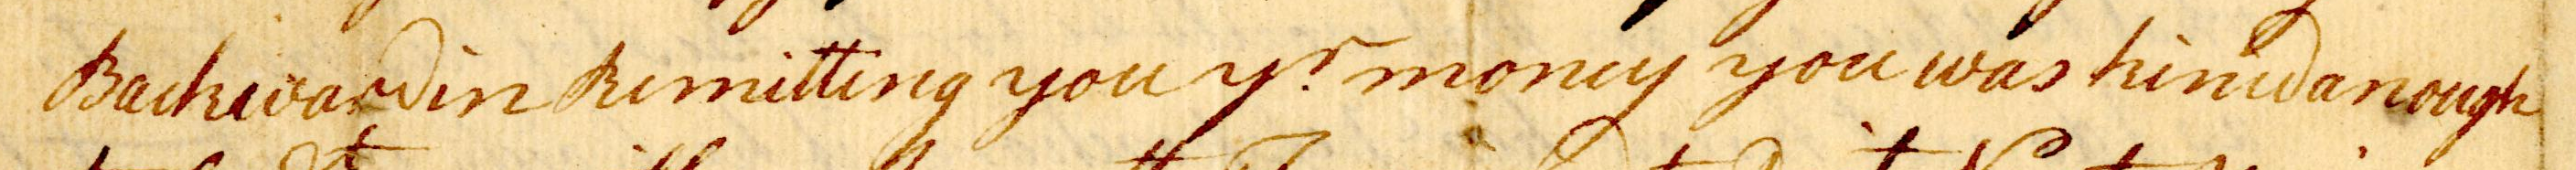Backward in Remitting you y^r. money you was kind anough
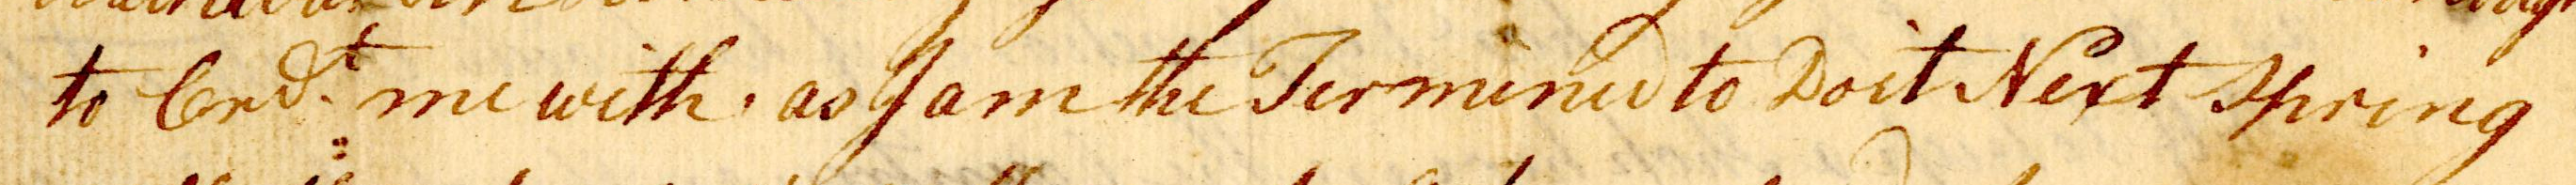to Crd^t. me with as I am the Termined to Do it Next spring
